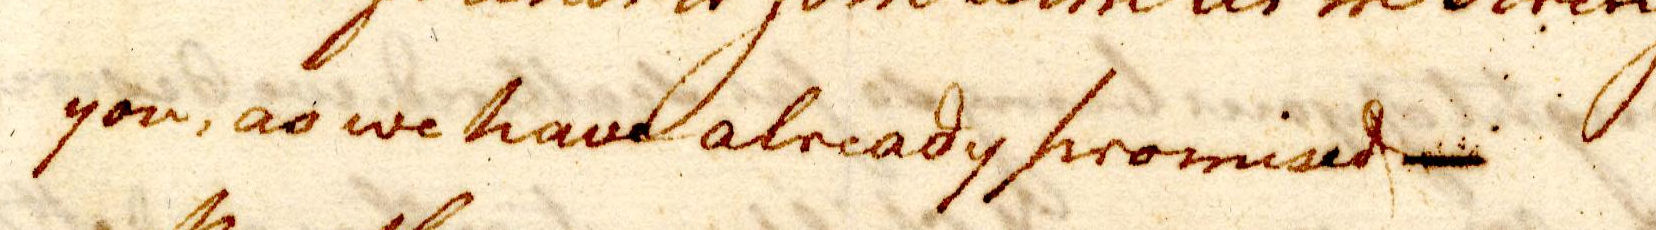you, as we have already promised-
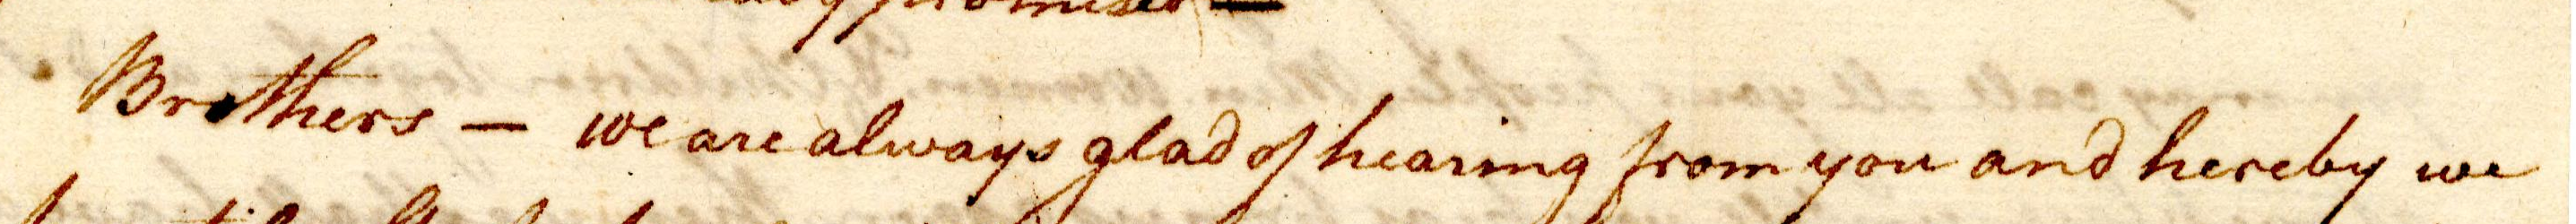Brothers- we are always glad of hearing from you and hereby we
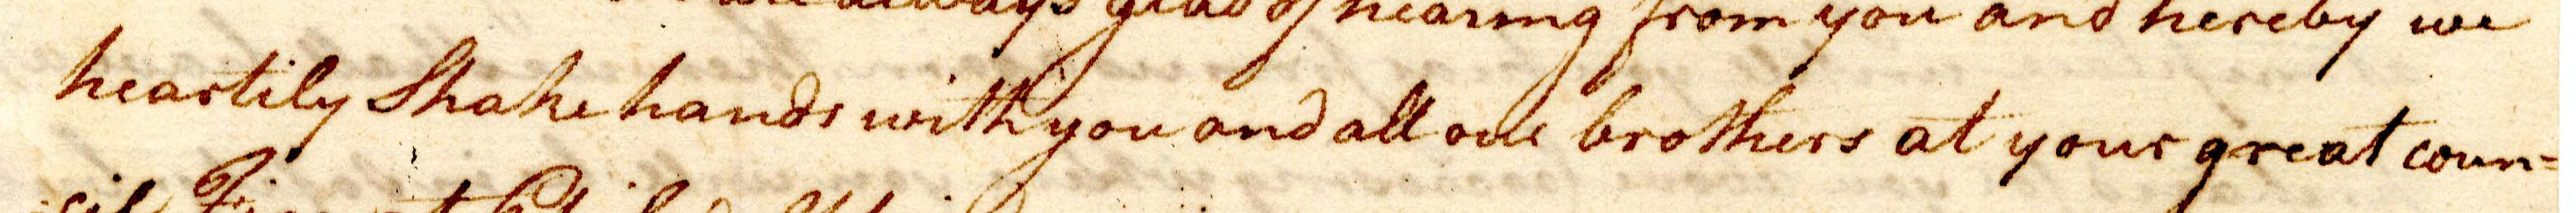heartily Shake hands with you and all our brothers at your great coun-
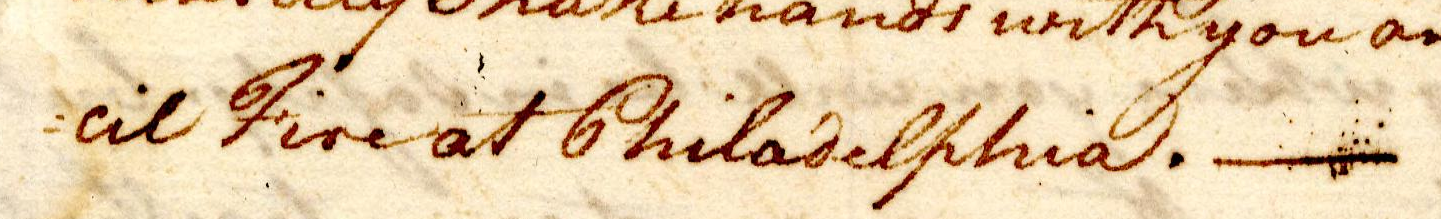-cil Fire at Philadelphia.-
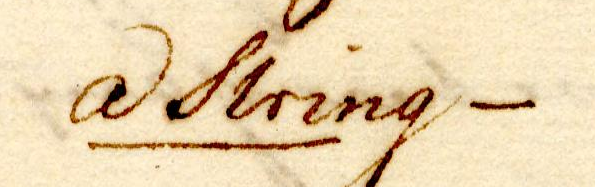a String-
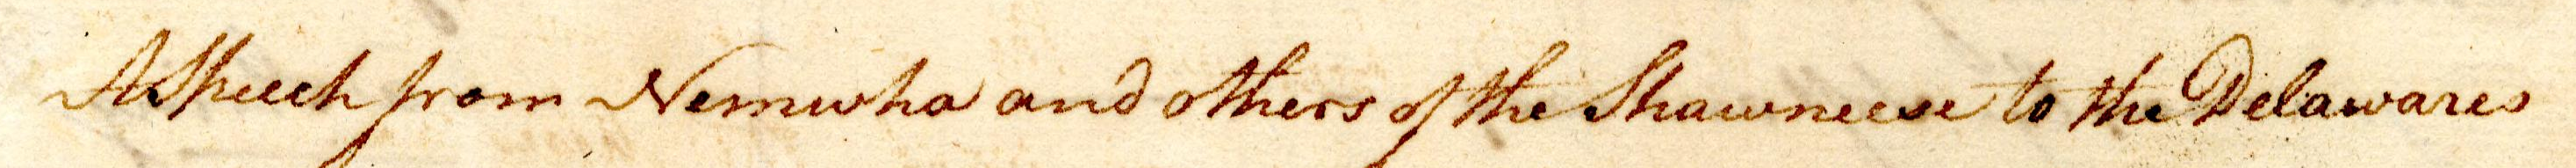A Speech from Nemwha and others of the Shawneese to the Delawares
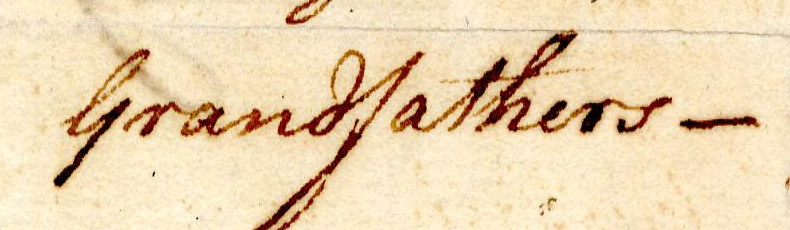Grandfathers-
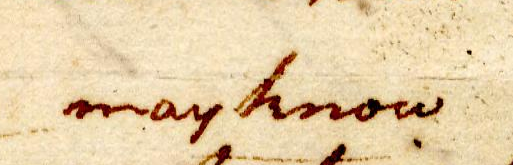may know
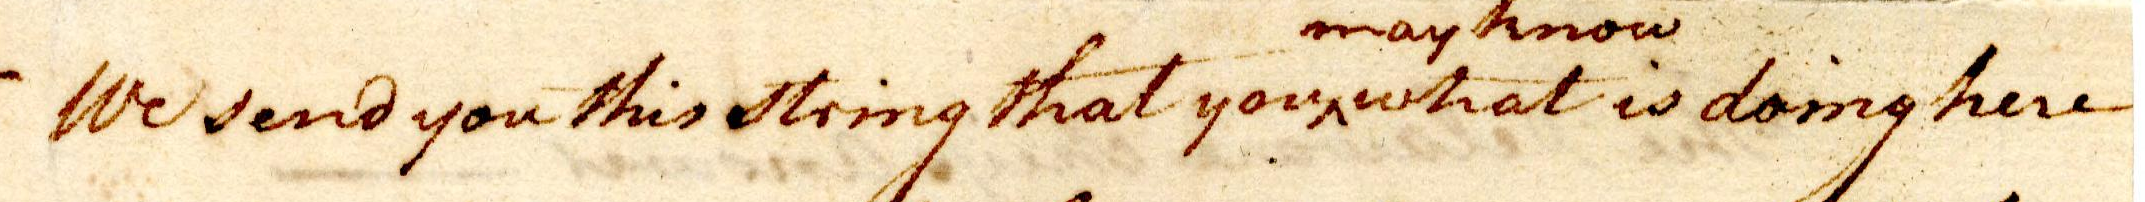We send you this string that you ^ what is doing here
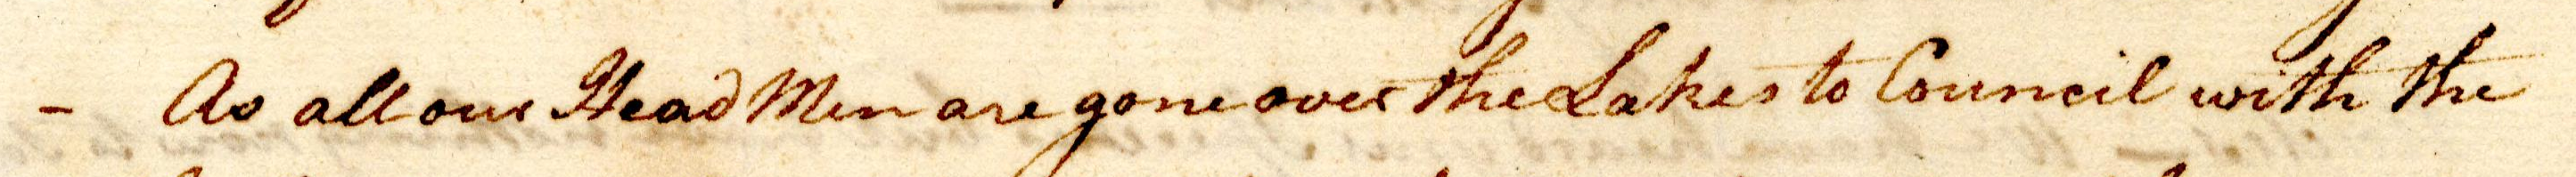- As all our Head Men are gone over the Lakes to Council with the
